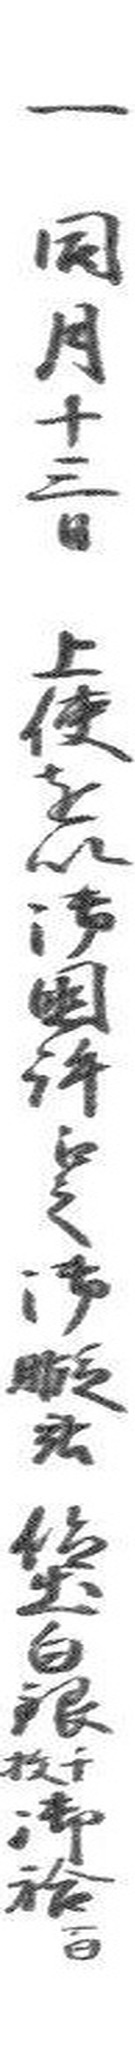一同月十三日上使を以御国許江之御暇被仰出白銀千枚御袷百
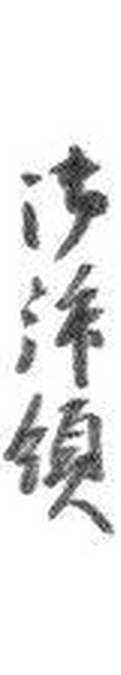御拝領
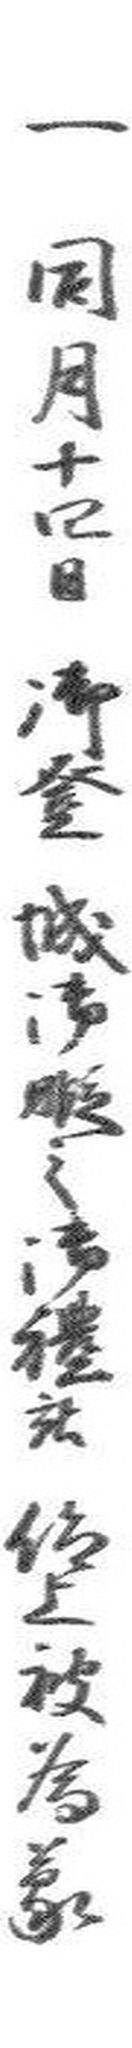一同月十四日御登城御暇之御礼被仰上被為蒙
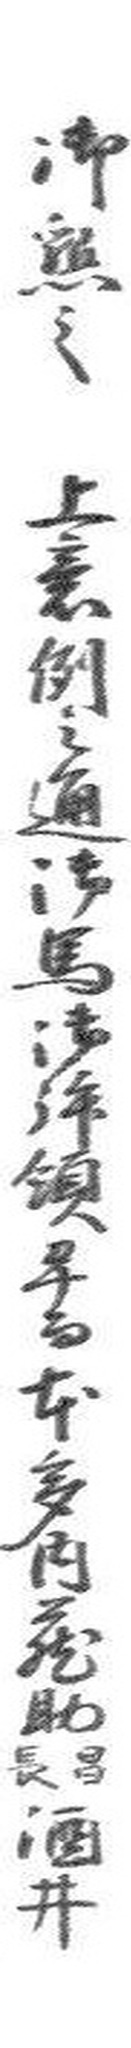御懇之上意例之通御馬御拝領畢而本多内蔵助昌長酒井
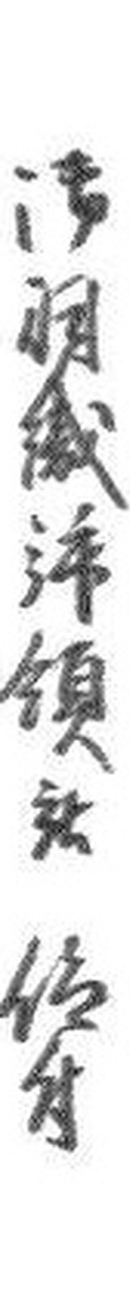御羽織拝領被仰付
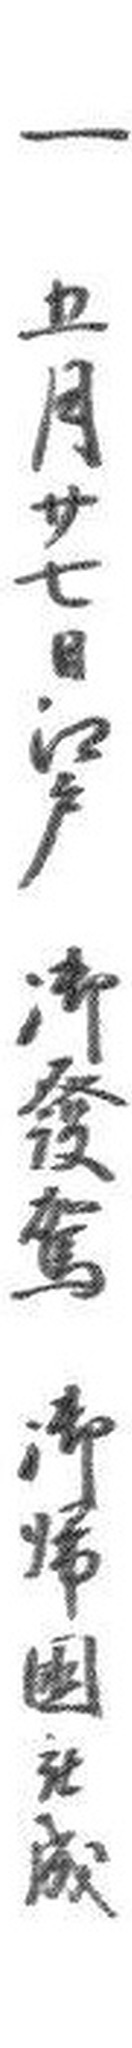一五月廿七日江戸御発駕御帰国被成
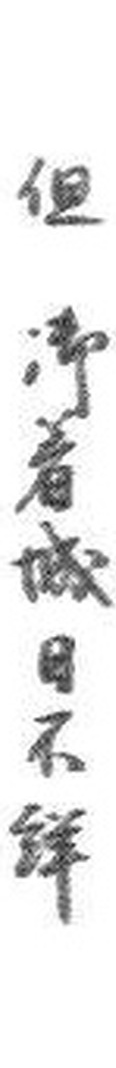但御着城日不詳

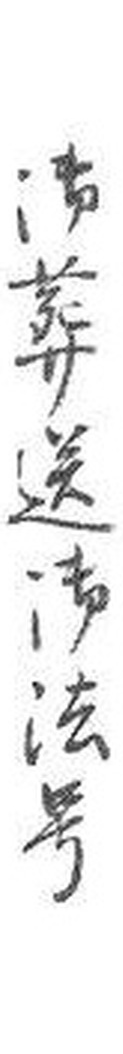御葬送御法号
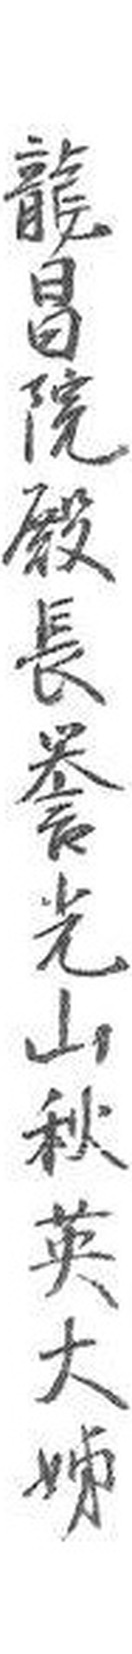竜昌院殿長誉光山秋英大姉
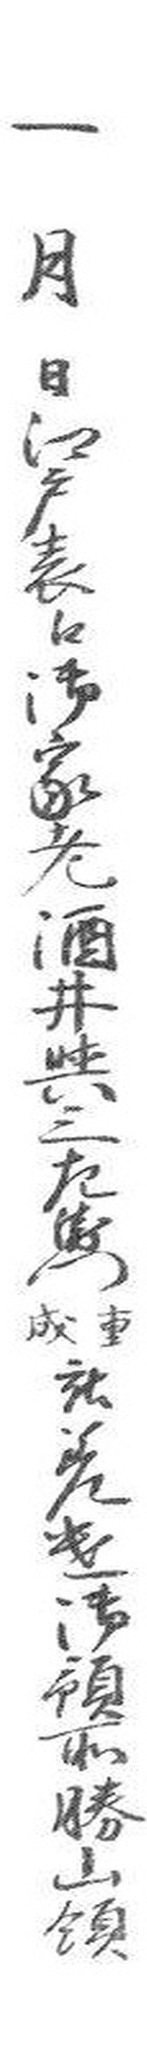一月日江戸表江御家老酒井与三左衛門重成被差遣御預所勝山領
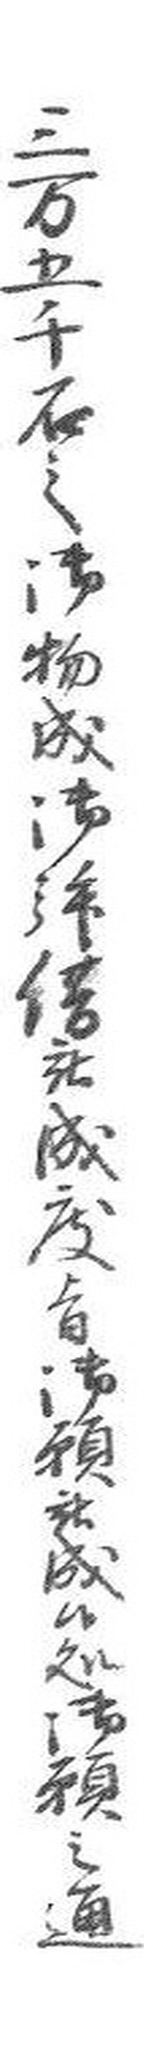三万五千石之御物成御拝借被成度旨御願被成候処御願之通
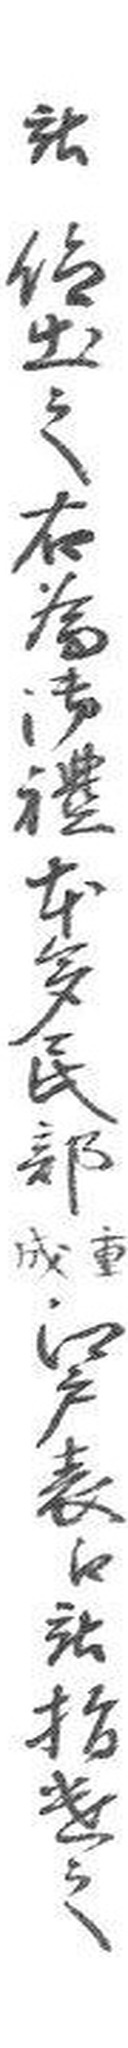被仰出之右為御礼本多民部重成江戸表江被指遣之
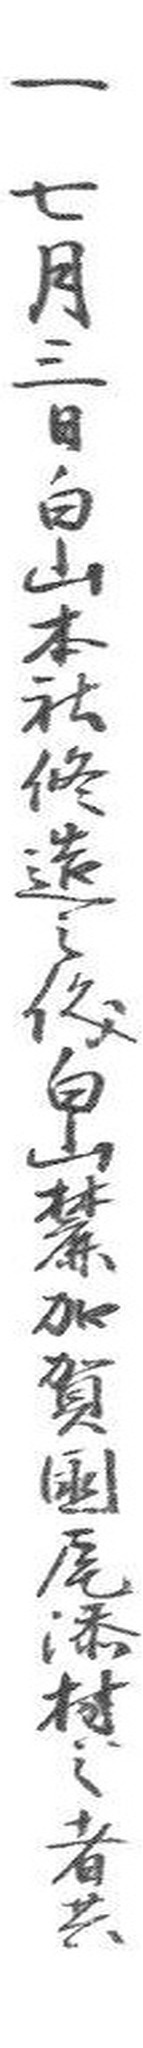一七月三日白山本社修造之儀白山麓加賀国尾添村之者共
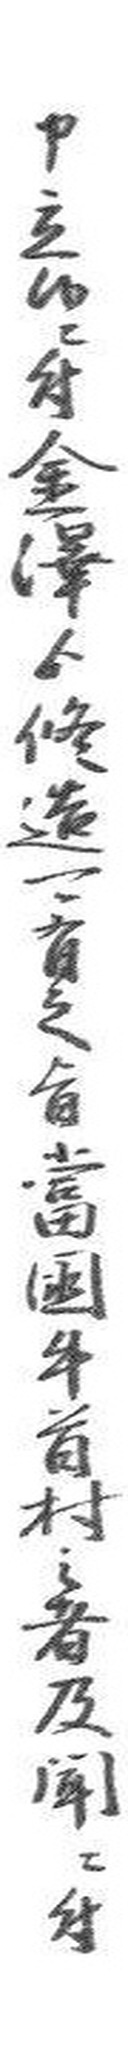申立候ニ付金沢ゟ修造可有之旨当国牛首村之者及聞ニ付
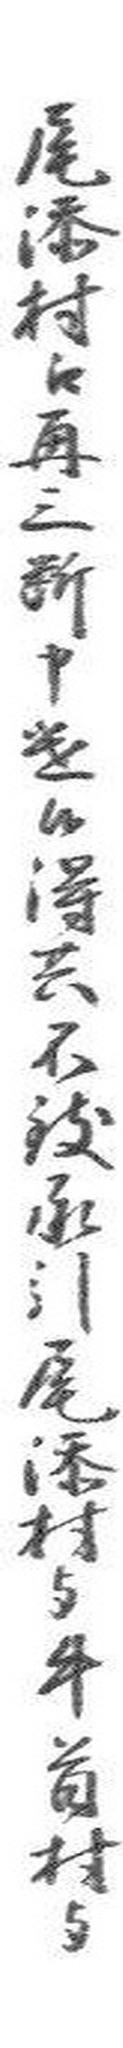尾添村江再三断申遣候得共不致承引尾添村と牛首村と
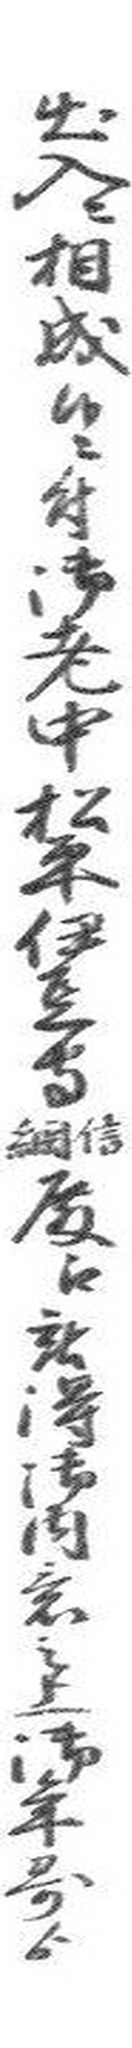出入ニ相成候ニ付御老中松平伊豆守信綱殿江被得御内意之上御
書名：家譜 五 光通公 従寛永十三年到万治二年
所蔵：福井県文書館 Fukui Prefectural Archives
